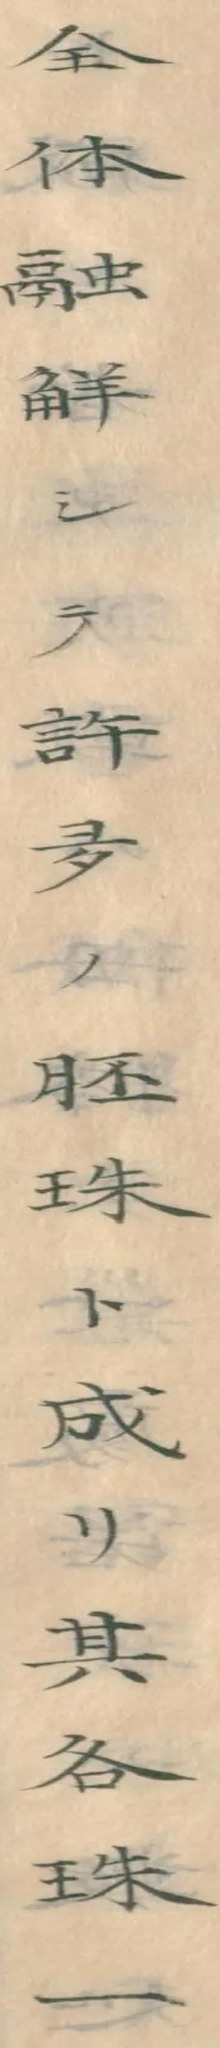全体融解シテ許多ノ胚珠ト成リ其各珠一
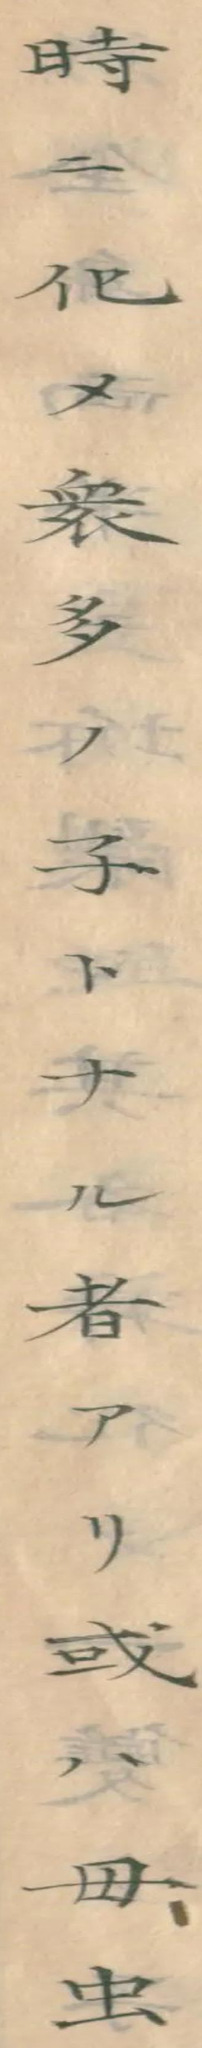時ニ化シテ衆多ノ子トナル者アリ或ハ母虫

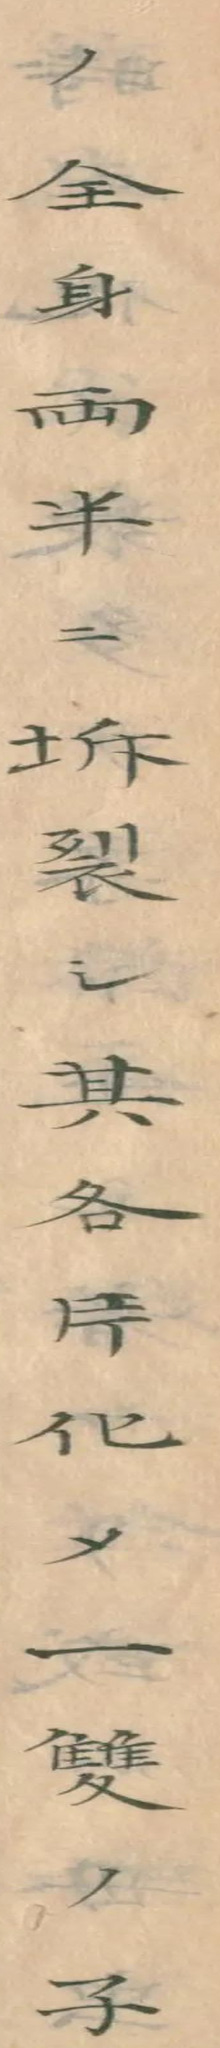ノ全身両半ニ坼裂シ其各片化シテ一双ノ子
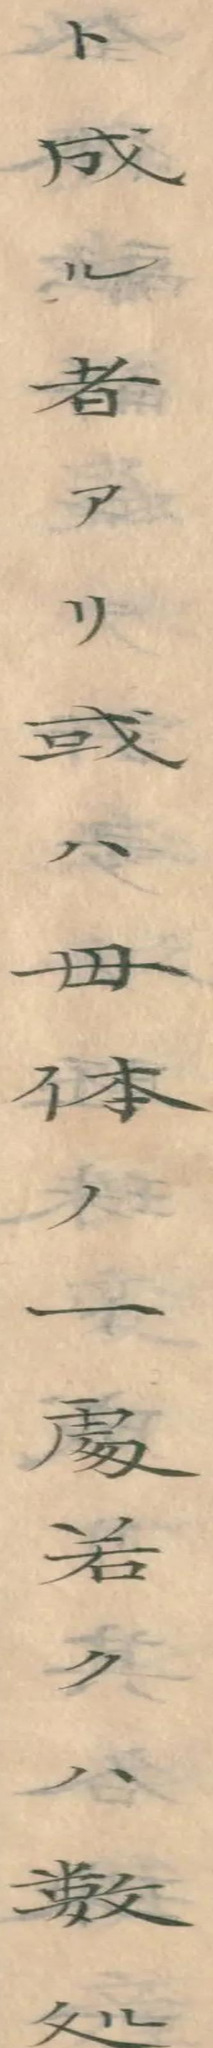ト成ル者アリ或ハ母体ノ一処若クハ数処
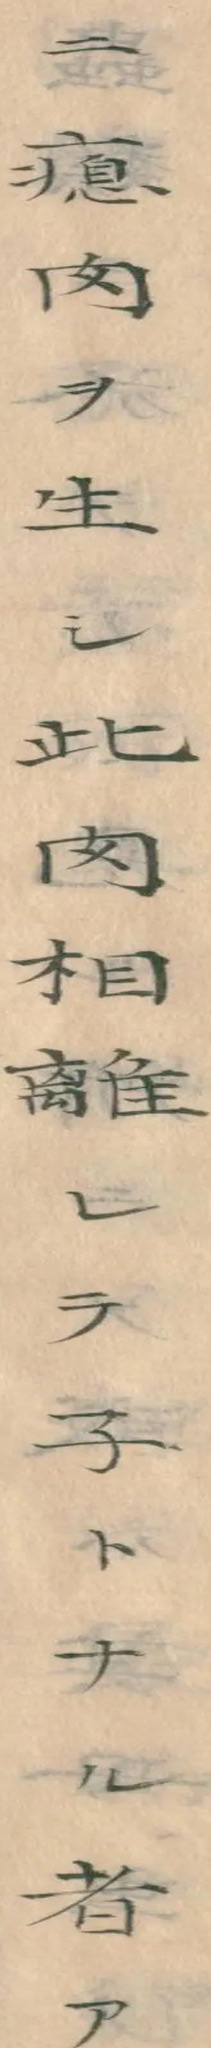ニ瘜肉ヲ生シ此肉相離レテ子トナル者ア
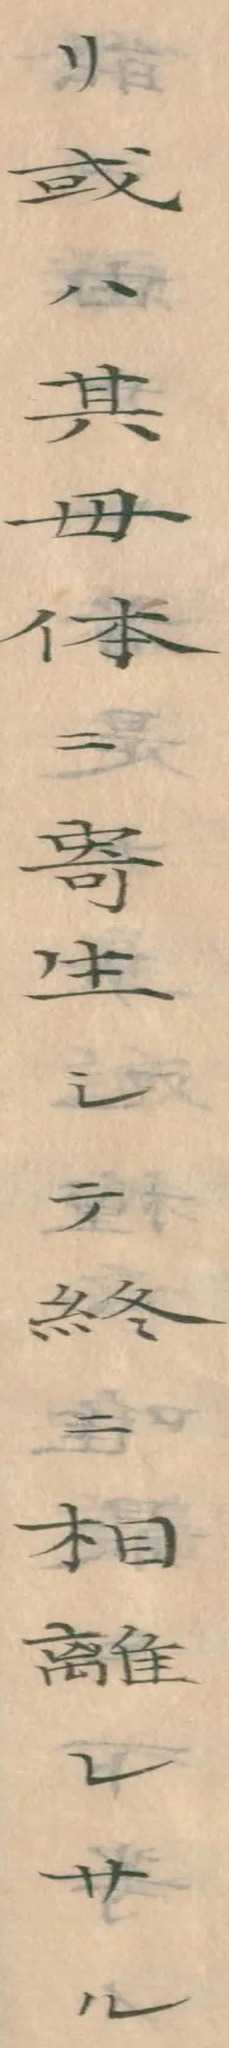リ或ハ其母体ニ奇生シテ終ニ相離レサル
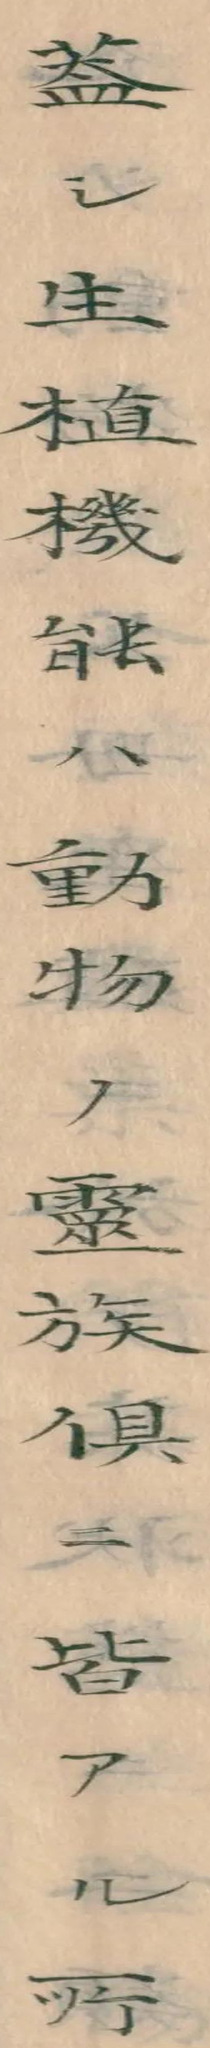蓋シ生植機能ハ動物ノ霊族倶ニ皆アル所
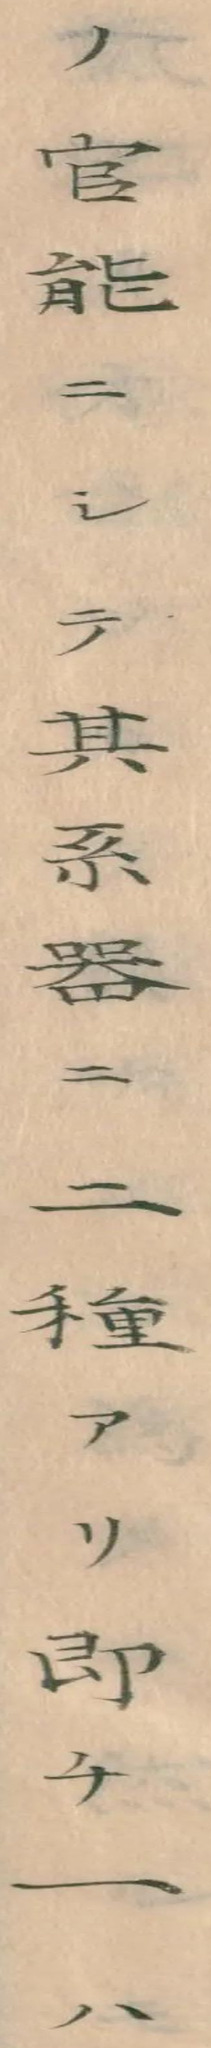ノ官能ニシテ其系器ニ二種アリ即チ一ハ
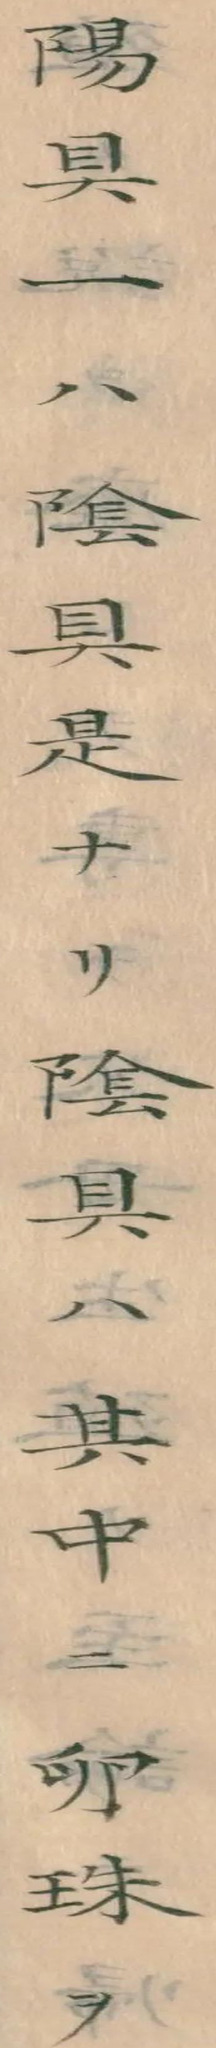陽具一ハ陰具是ナリ陰具ハ其中ニ卵珠ヲ
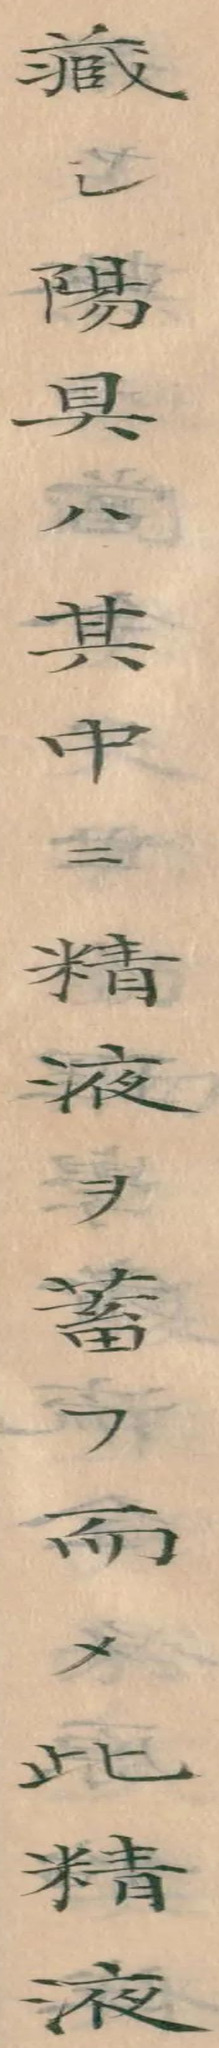蔵シ陽具ハ其中ニ精液ヲ蓄フ而シテ此精液
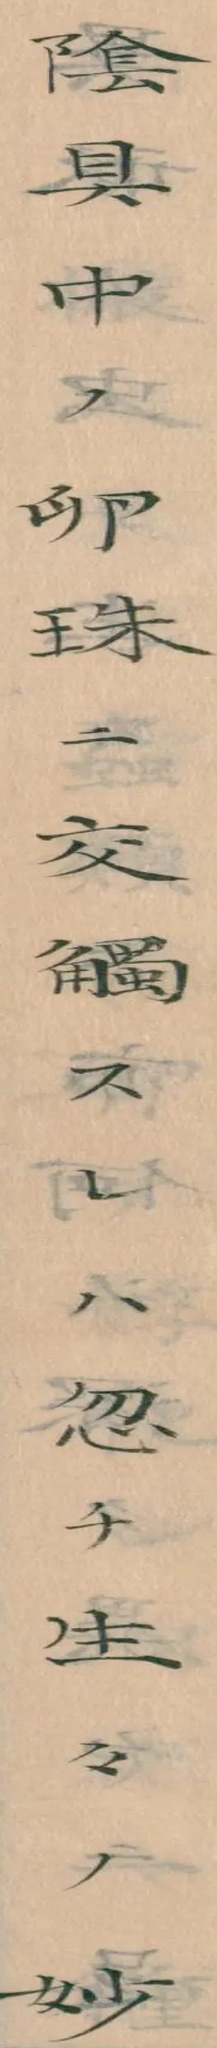陰具中ノ卵珠ニ交触スレハ忽チ生々ノ妙
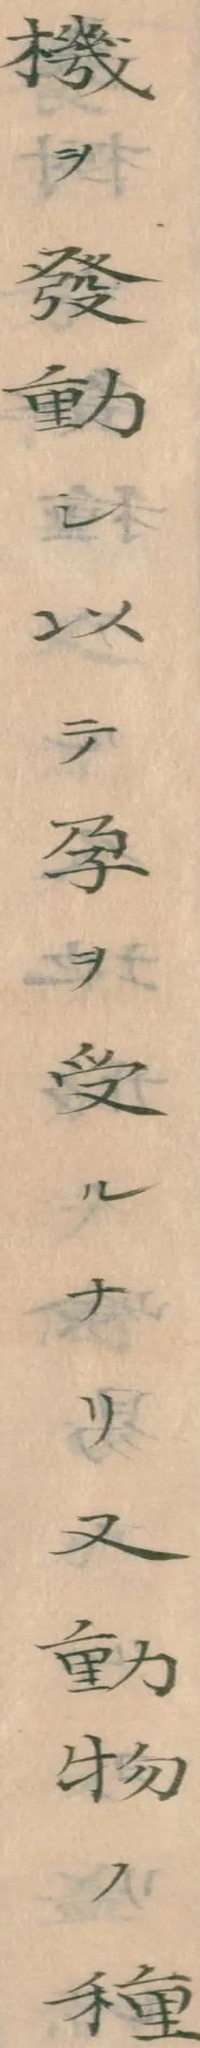機ヲ発動シ以テ孕ヲ受ルナリ又動物ノ種
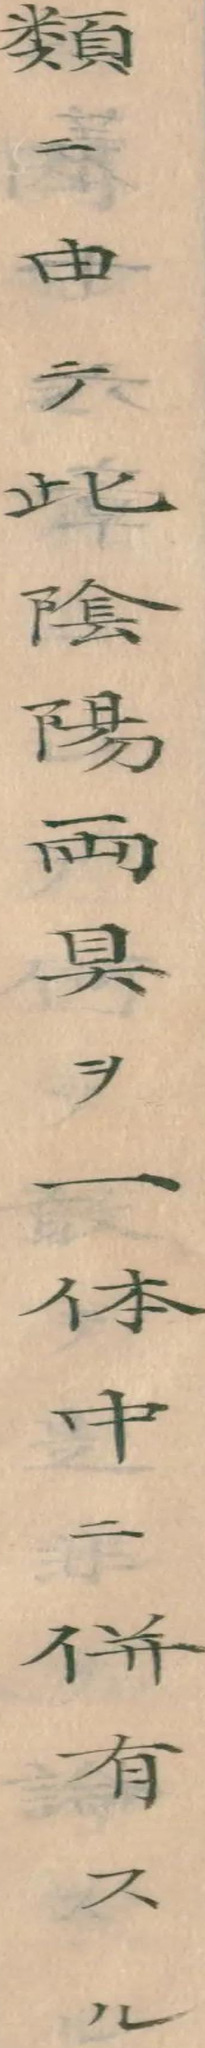類ニ由テ此陰陽両具ヲ一体中ニ併有スル
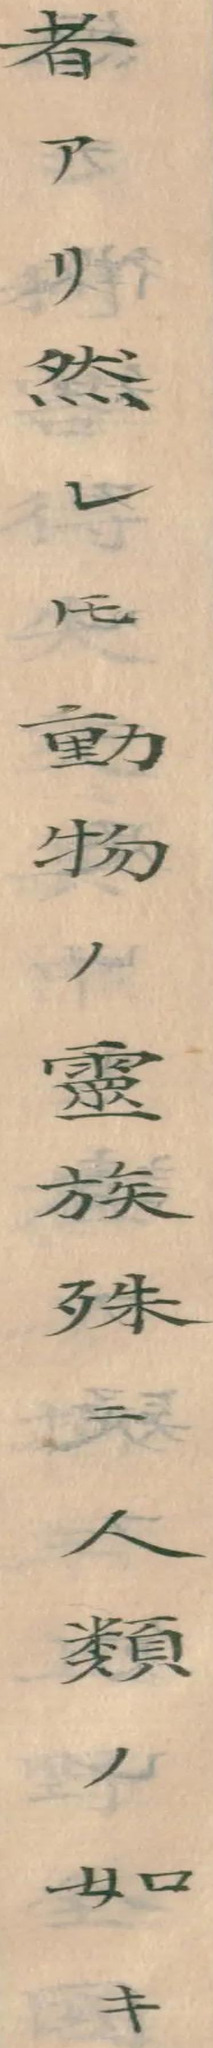者アリ然レトモ動物ノ霊族殊ニ人類ノ如キ
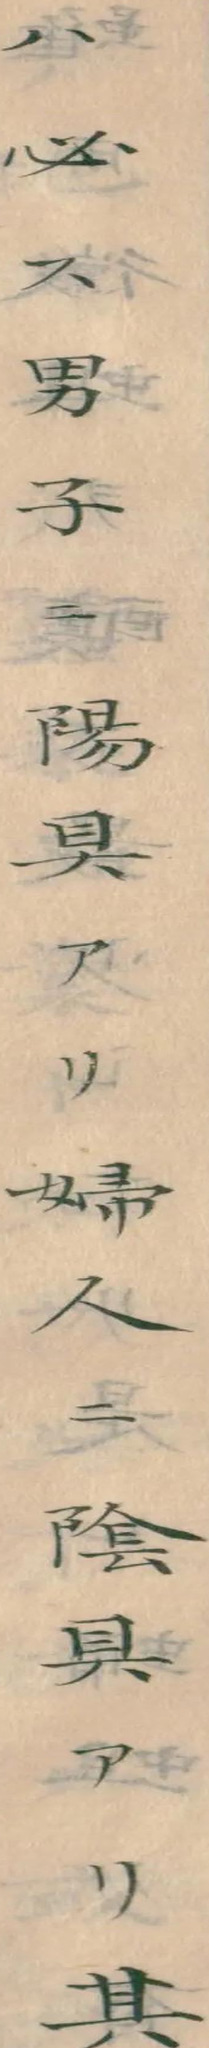ハ必ス男子ニ陽具アリ婦人ニ陰具アリ其
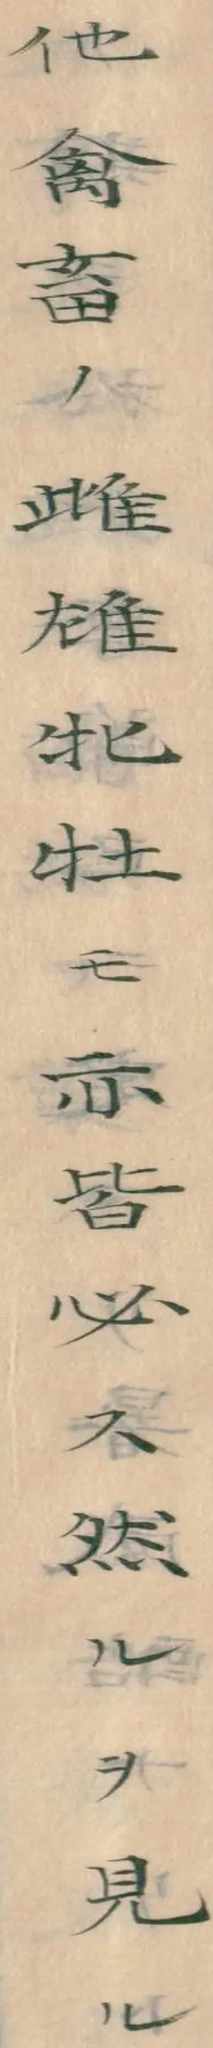他禽畜ノ雌雄牝牡モ亦皆必ス然ルヲ見ル
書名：蚕桑集成
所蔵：国立国会図書館 National Diet Library, JAPAN
